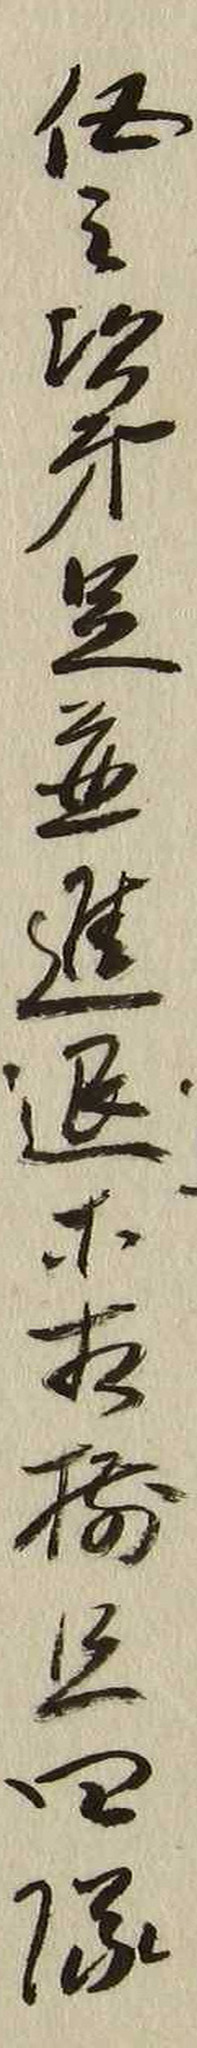伍之次第足並進退等相揃且四隊
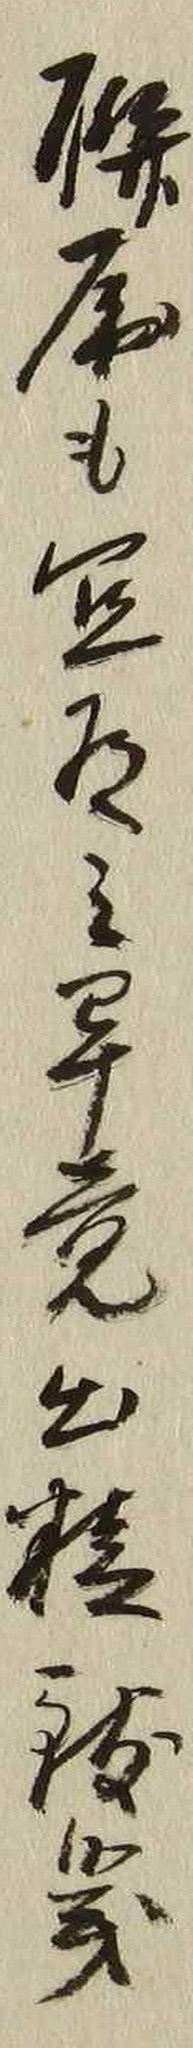聯属も宜有之畢竟出精致候義
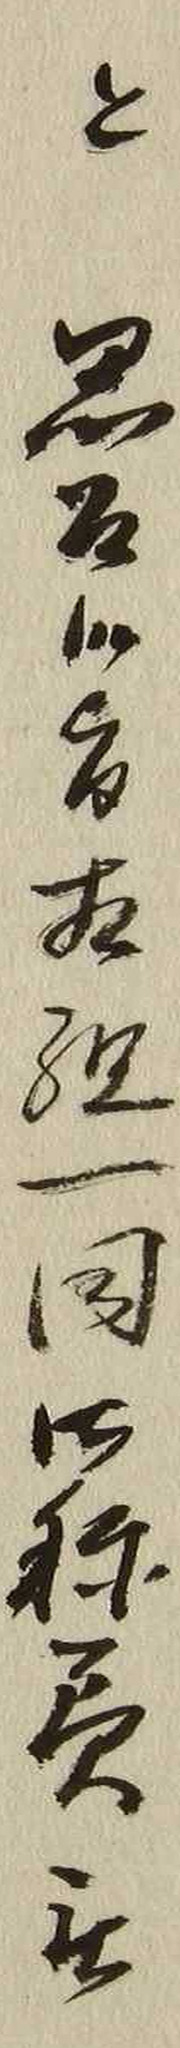と思召候旨相組一同御称美被
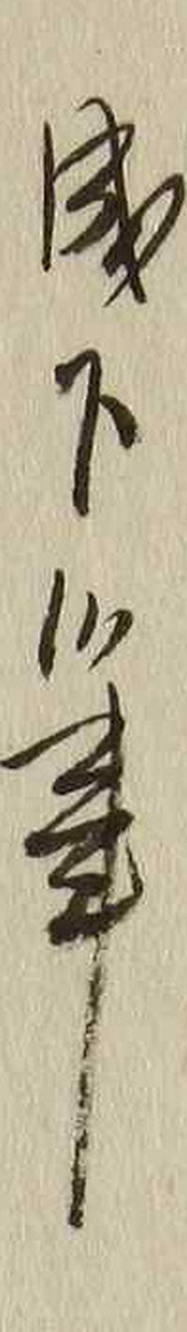成下候事
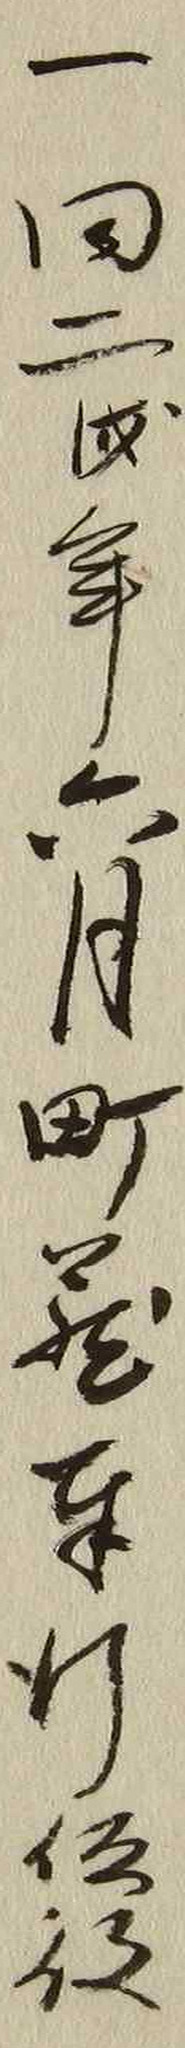一同二戌年六月町蔵奉行仮役
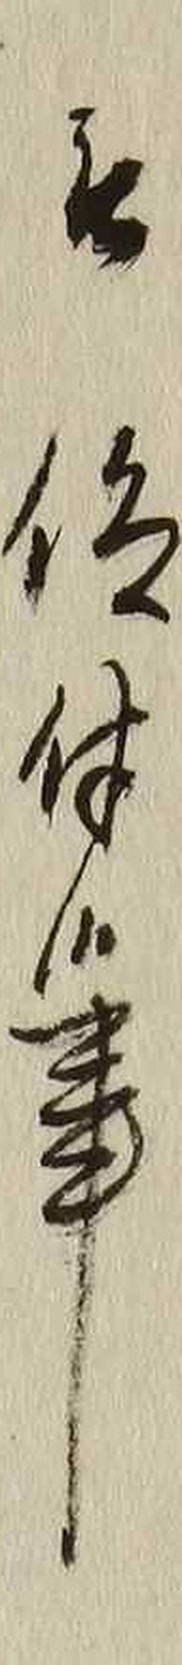被仰付候事
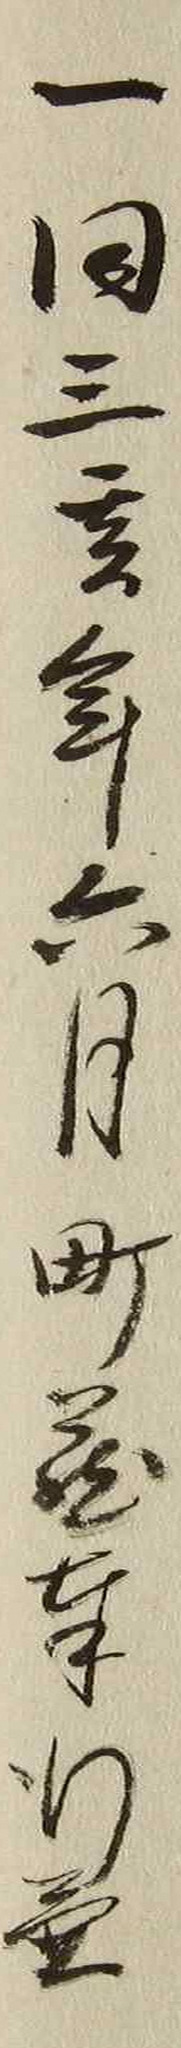一同三亥年六月町蔵奉行兼
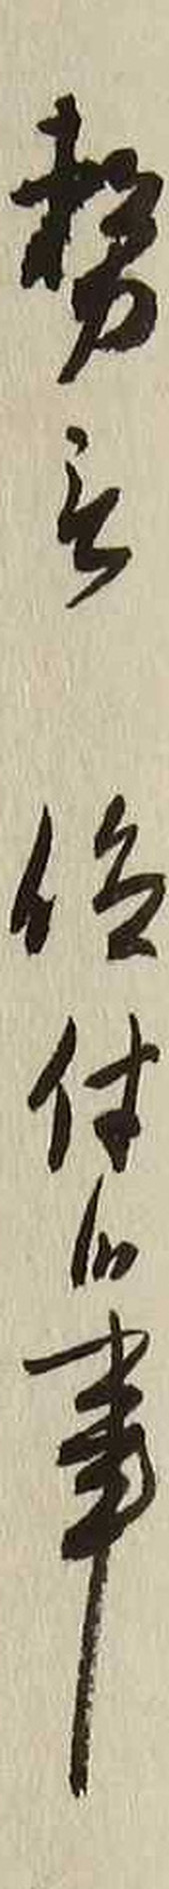務被仰付候事
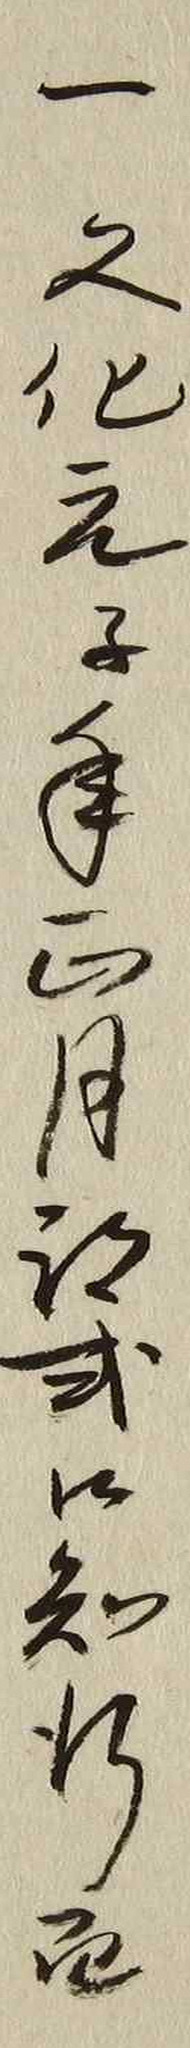一文化元子年正月跡式御知行百
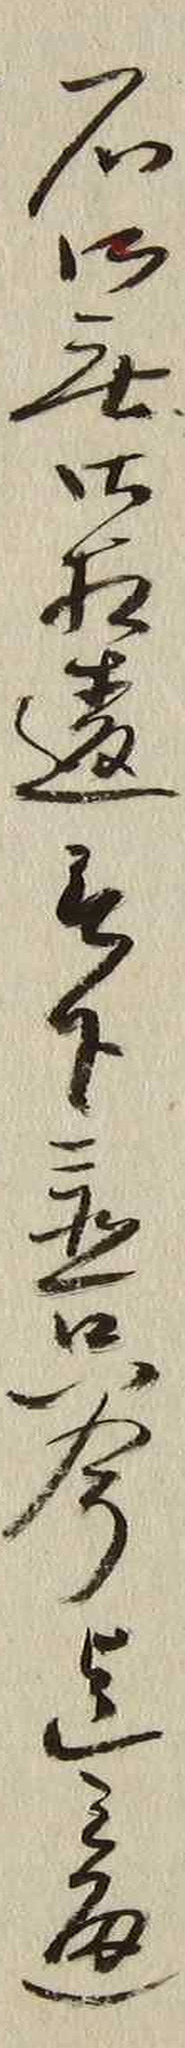石御無御相違被下置只今迄之通
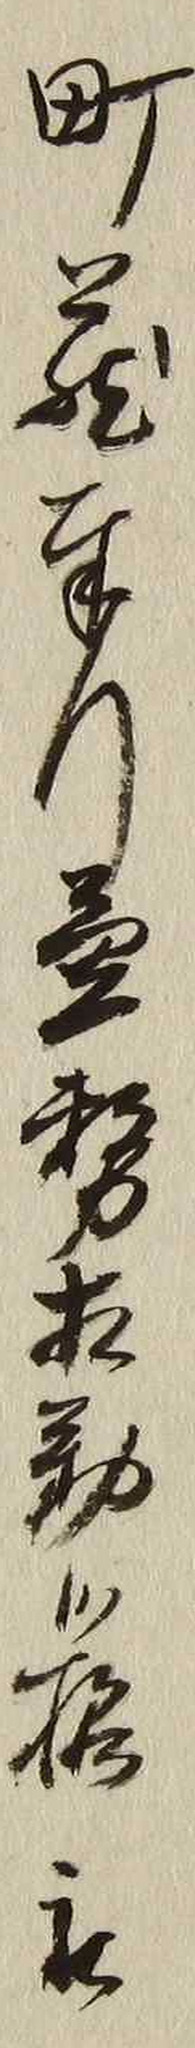町蔵奉行兼務相勤候様被
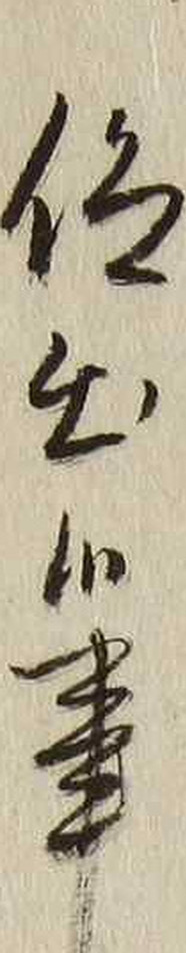仰出候事
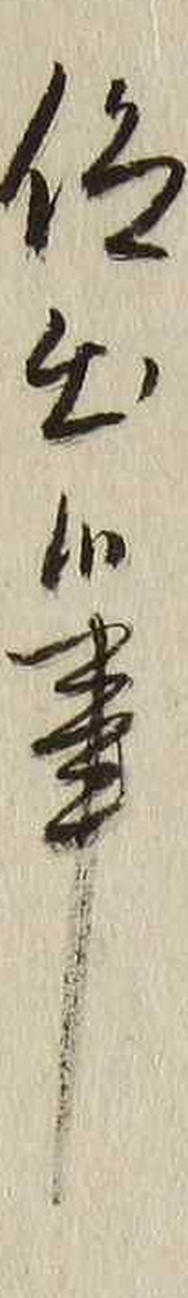仰出候事
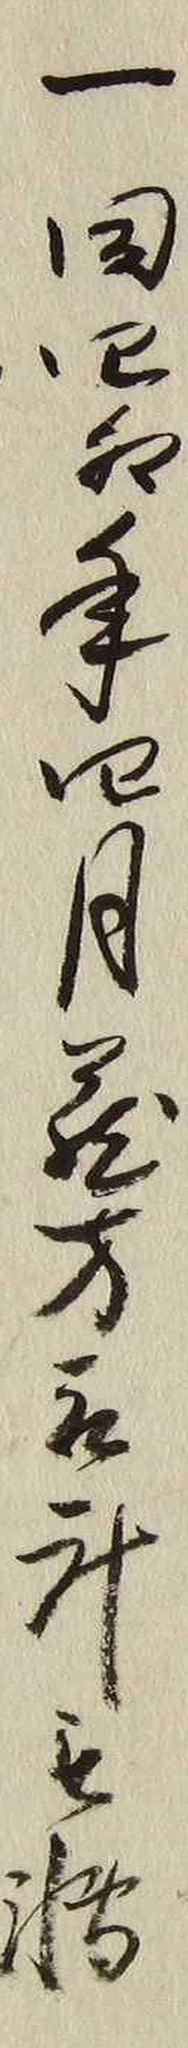一同四卯年四月蔵方取計被転
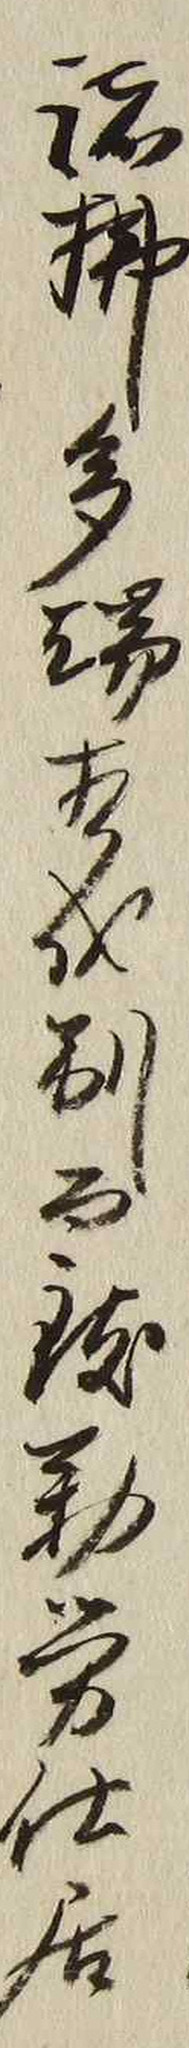諸掛多端相成別而致勤労仕居
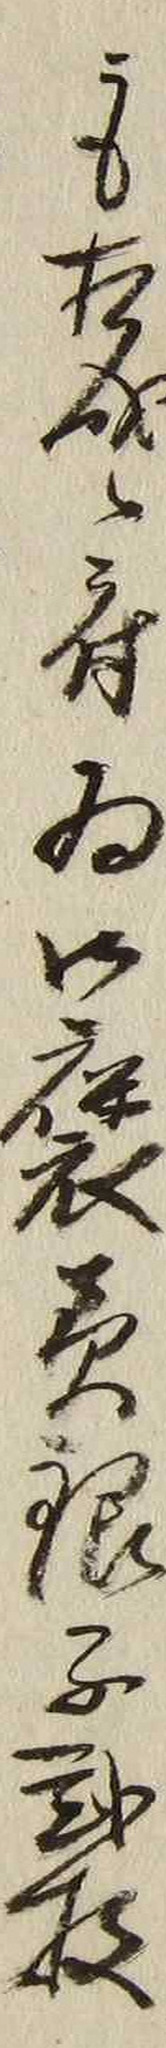ニも相成候ニ付為御褒美銀子弐枚
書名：諸士系譜　巻之346　も之部2
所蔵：会津若松市立会津図書館
